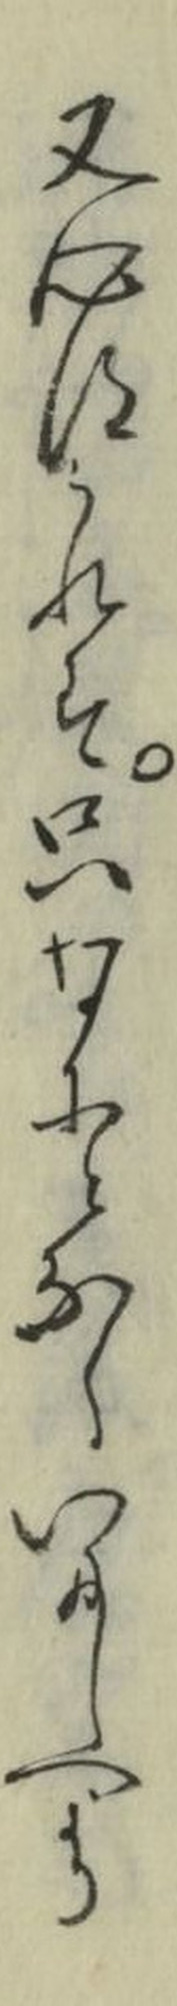又心得られす。只なにとなくいにしへより
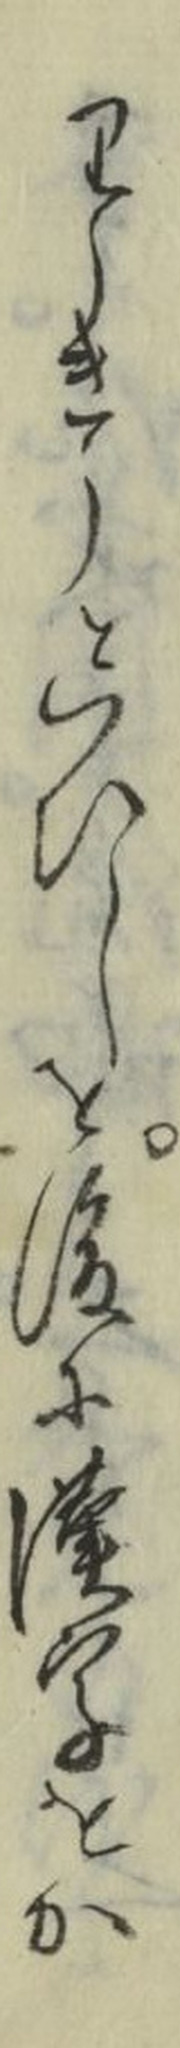りうきうといひしを。後に漢字をか

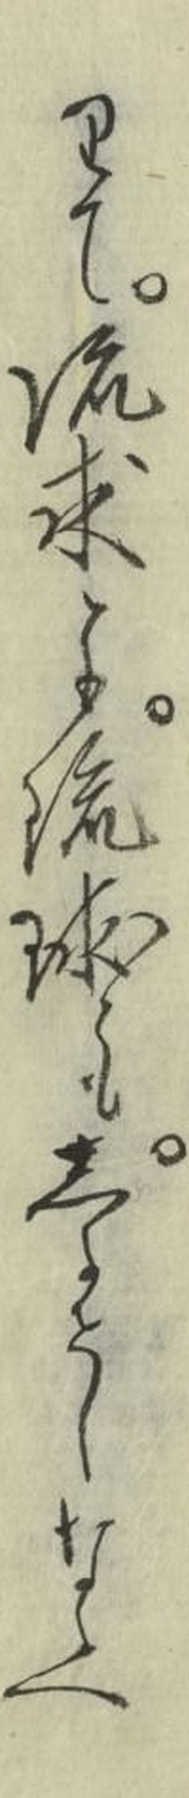りて。流求とも。琉球とも。しるせしなるへ
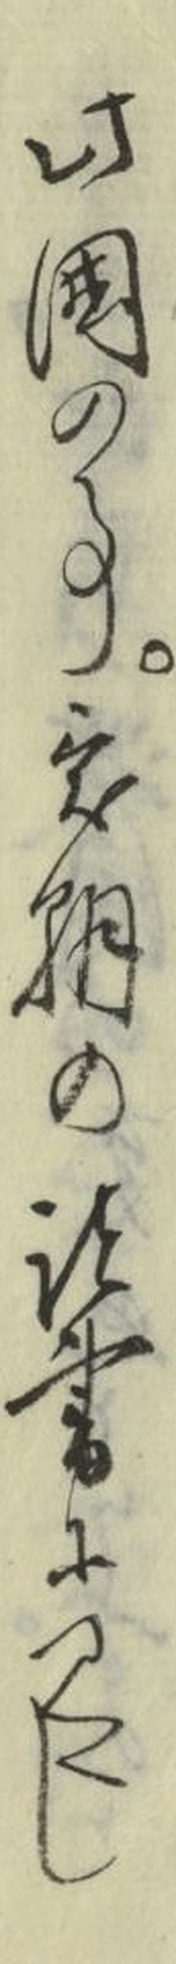此国の事。異朝の諸書に見へし
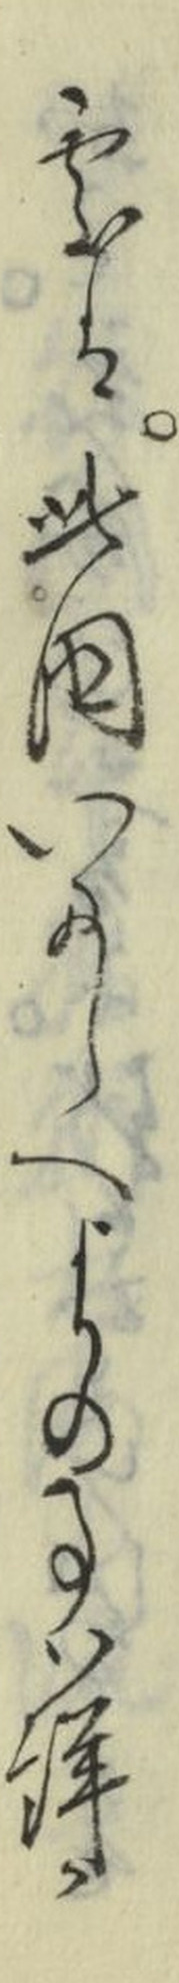処は。此国いにしへよりの事は詳か
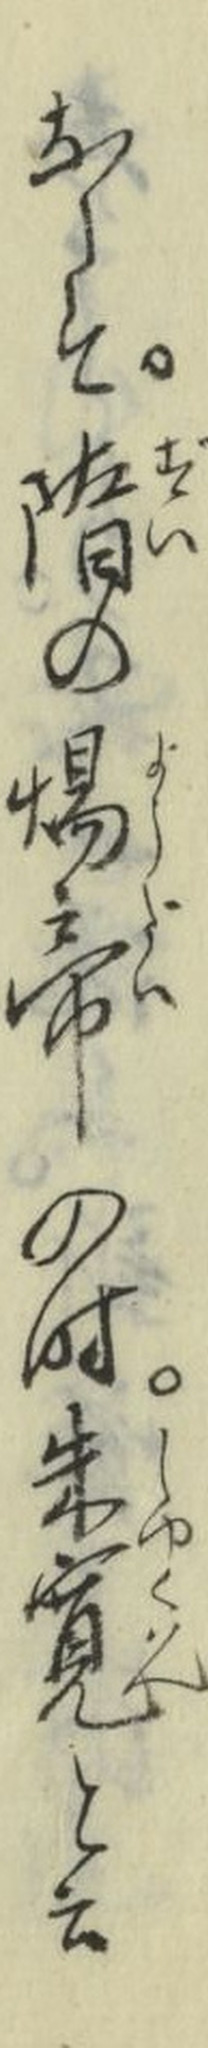ならす。隋の煬帝の時。朱寛と云
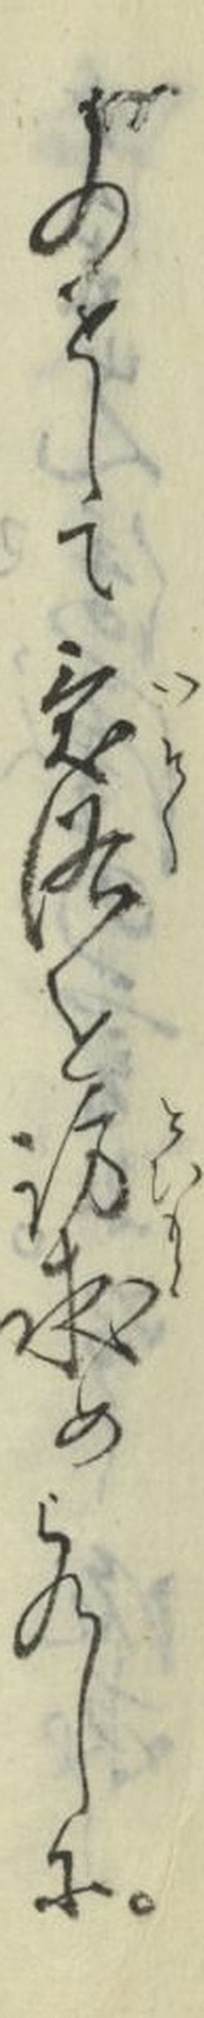ものをして異俗を訪求められしに。
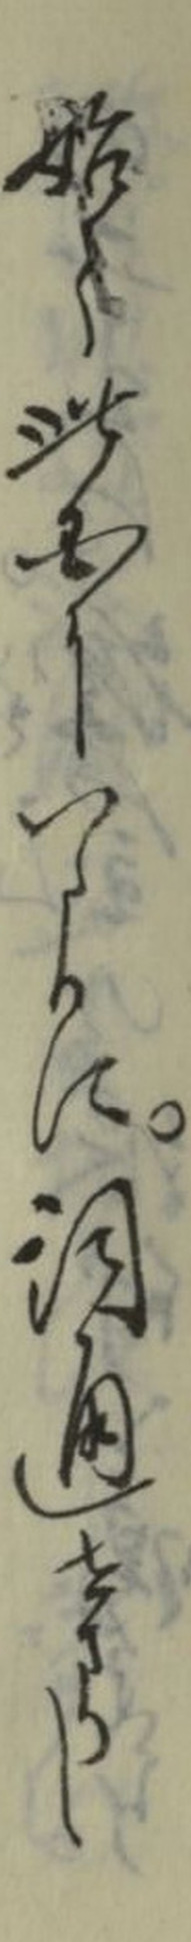始て此国にいたるに。詞通せさりし
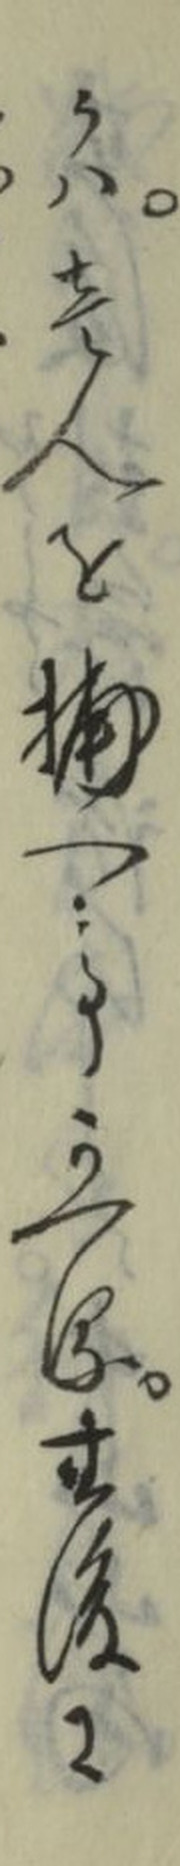かは。壱人を捕へてかへる。其後に
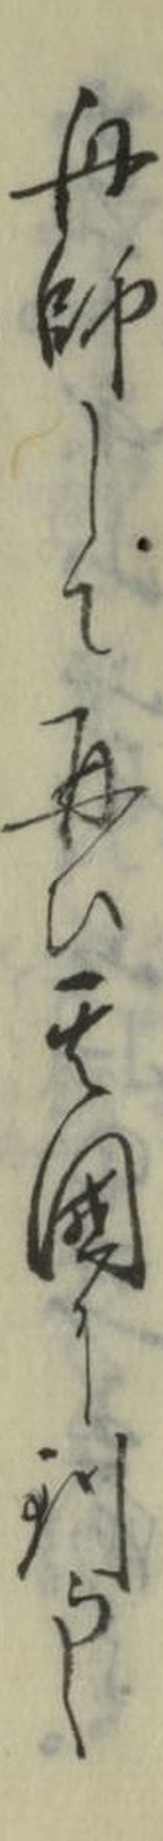舟師して再ひ其国に到らし
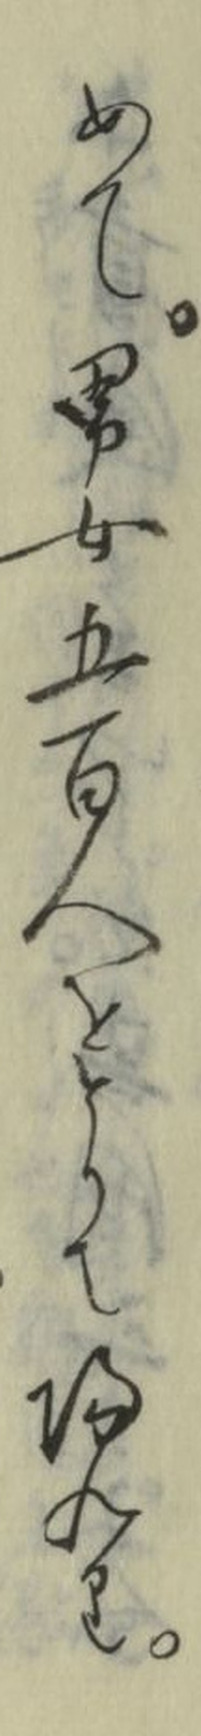めて。男女五百人をとりて帰れり。
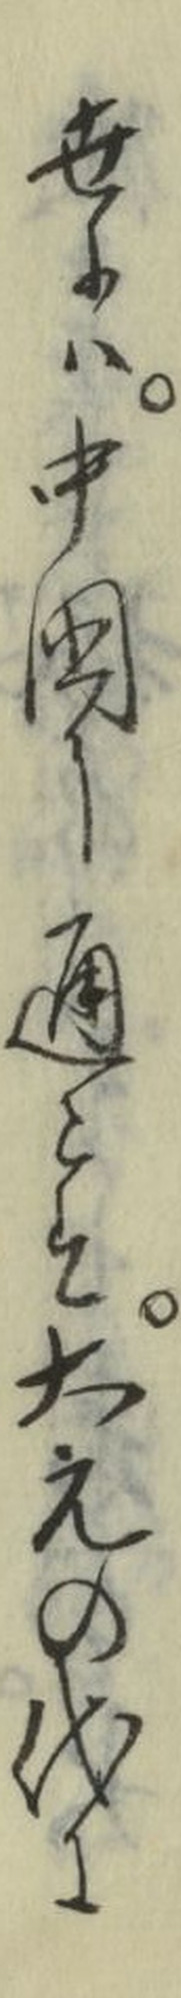世には。中国に通せす。大元の代に

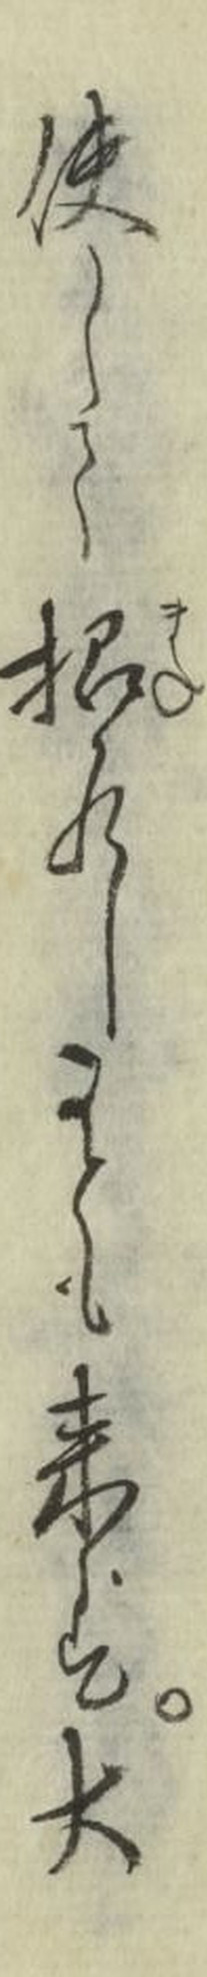使して招かれしかとも来らす。大
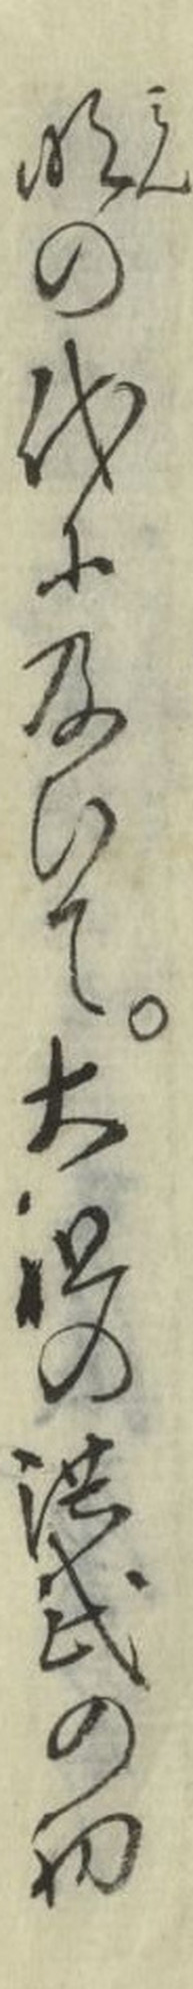明の代に及ひて。大祖の洪武の初
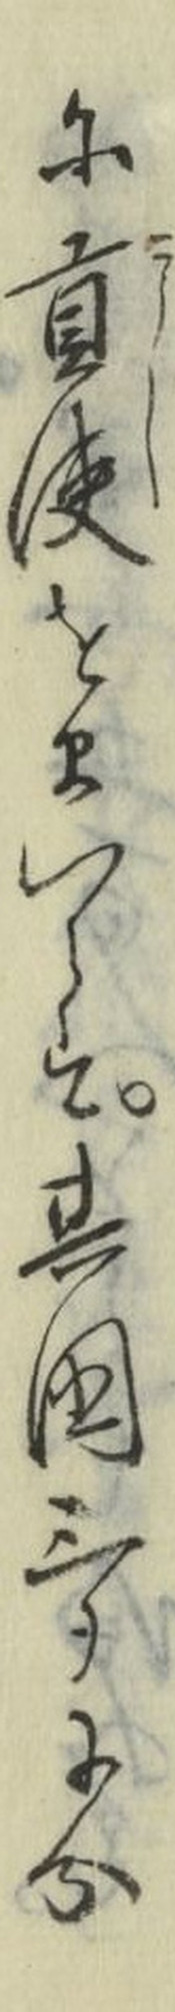に貢使をまいらす。其国三ツに分
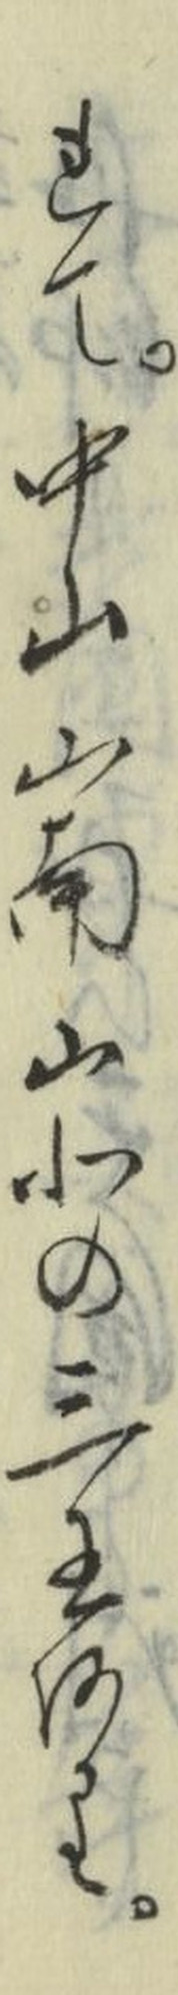れて。中山山南山北の三王あり。
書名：琉球人来朝記 一之二
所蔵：University of the Ryukyus Library
